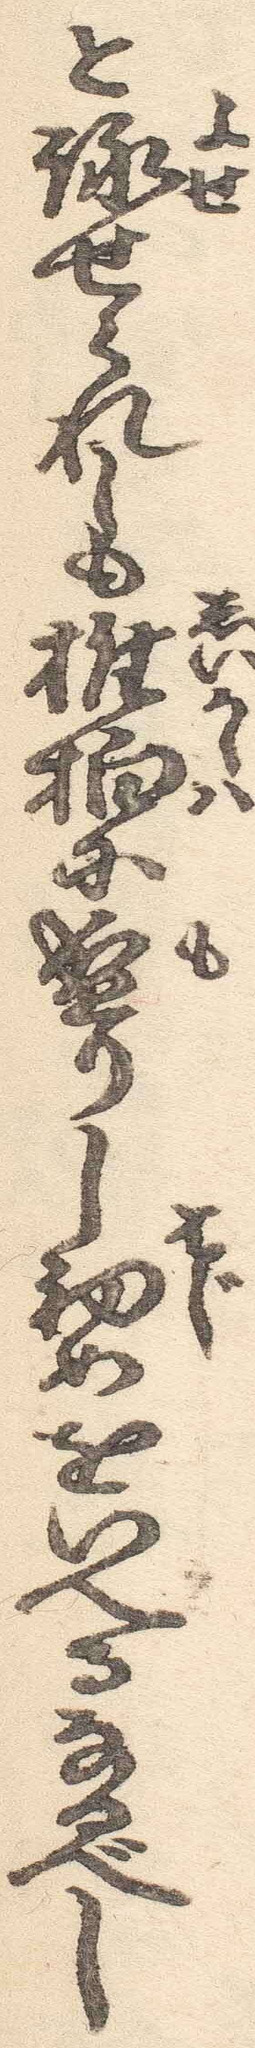と詠せられしも椎柏に盛りし初めをいへるなるべし
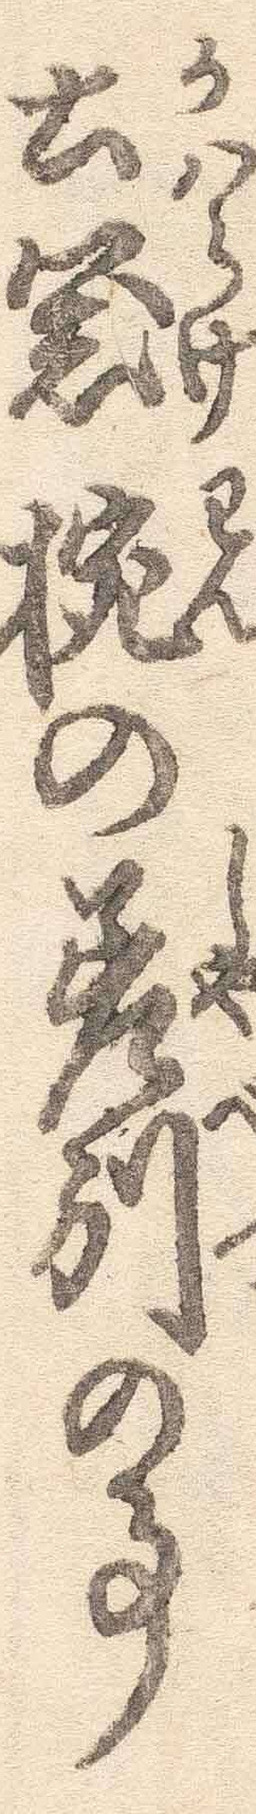土器椀の差別の事
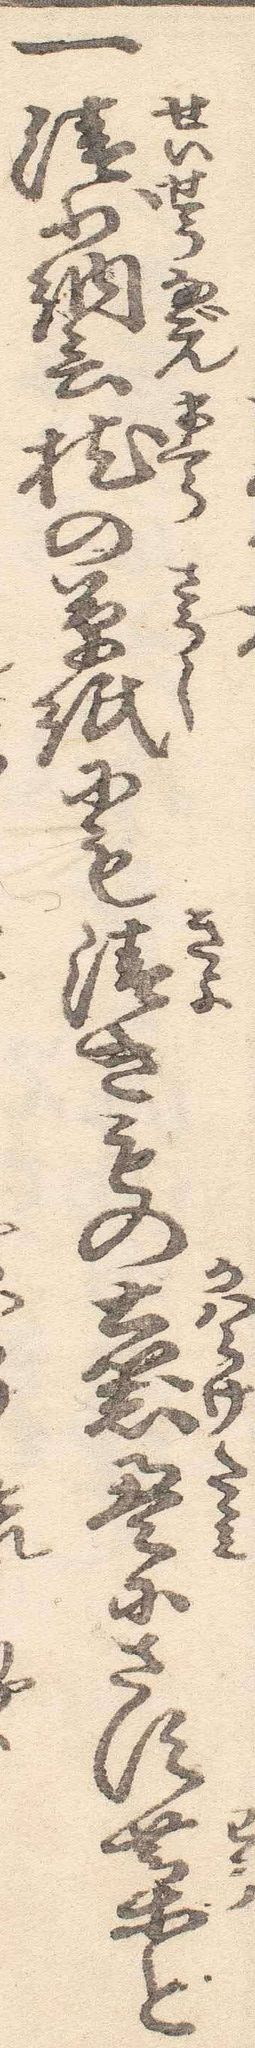一清少納言枕の草紙にも清きもの土器畳にさす若木と
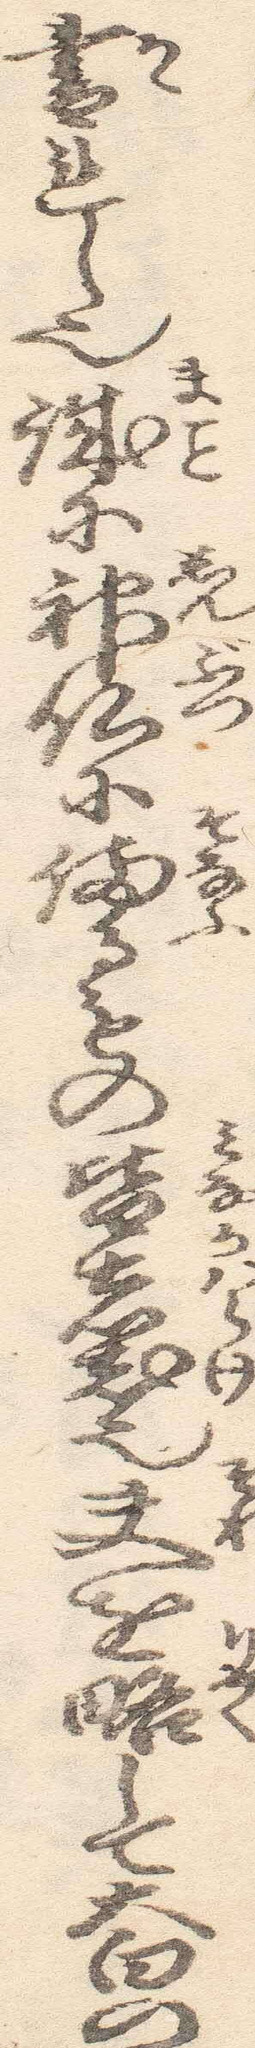書れし也誠に神仏に備るもの皆土器也夫を略して大白の
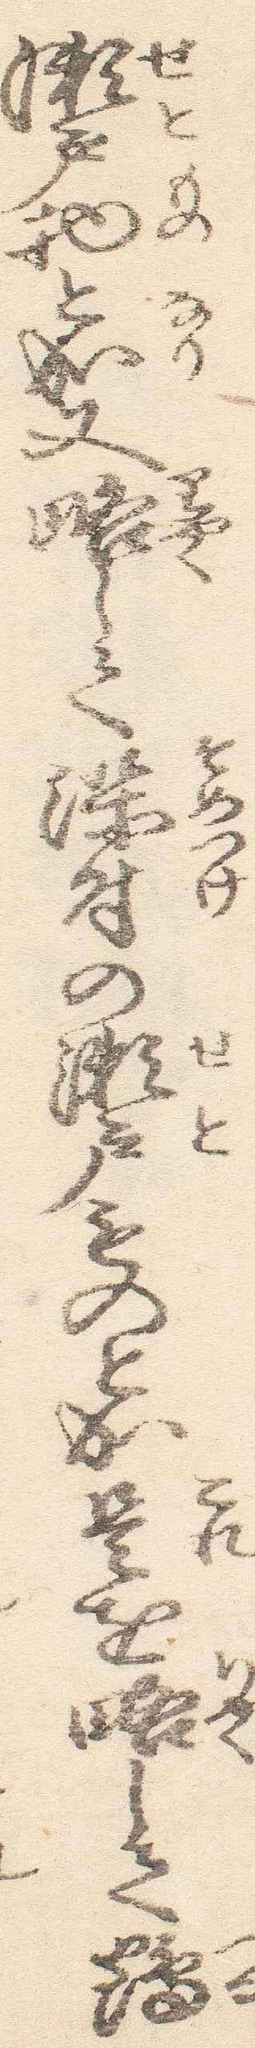瀬戸物と成又略して染付の瀬戸ものと成是を略して鶴
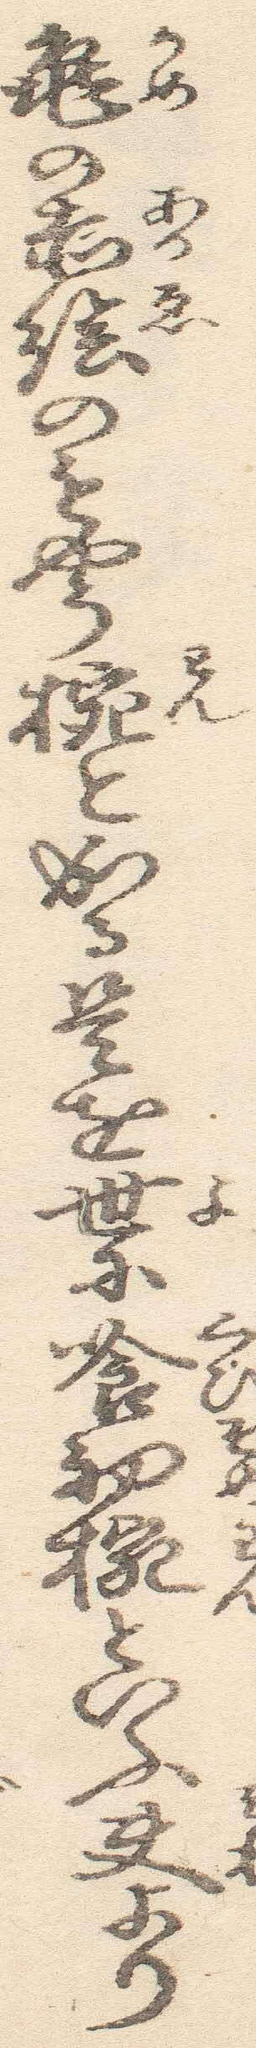亀の赤絵のもやう椀と成る是を世に喰初椀といふ夫より
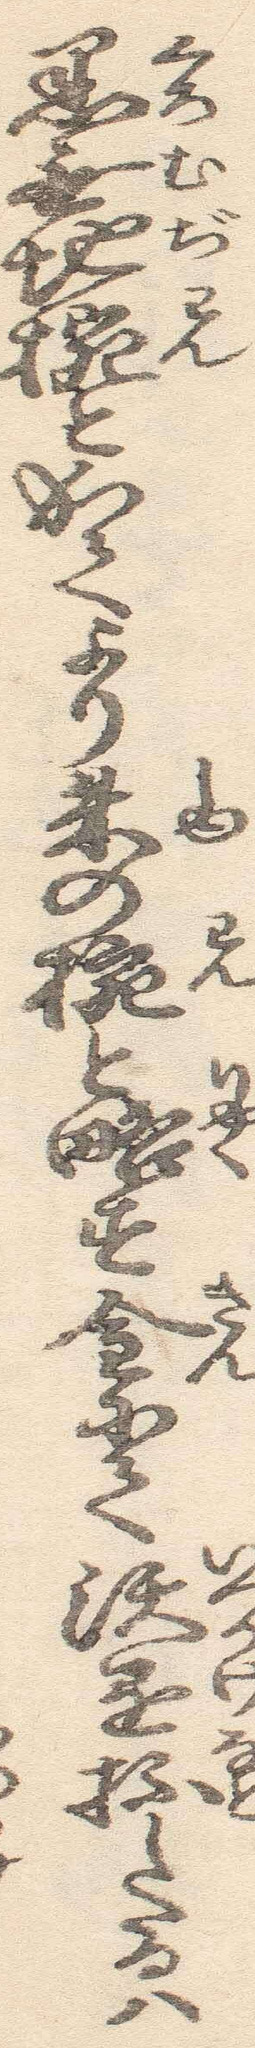黒無地椀と成てより朱の椀と略す金にて沃懸抔したるは
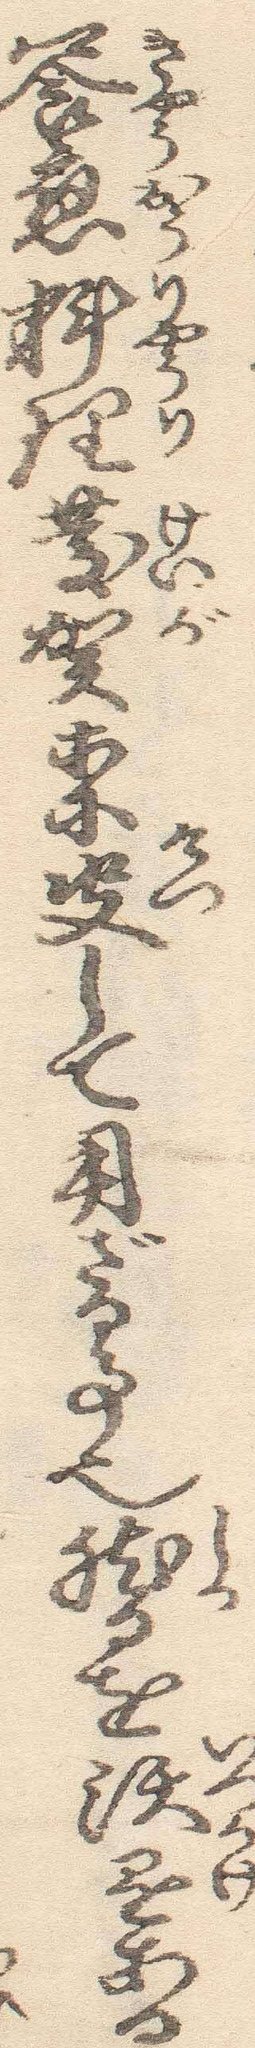饗応料理慶賀等に決して用ざる事也然るを沃懸ある
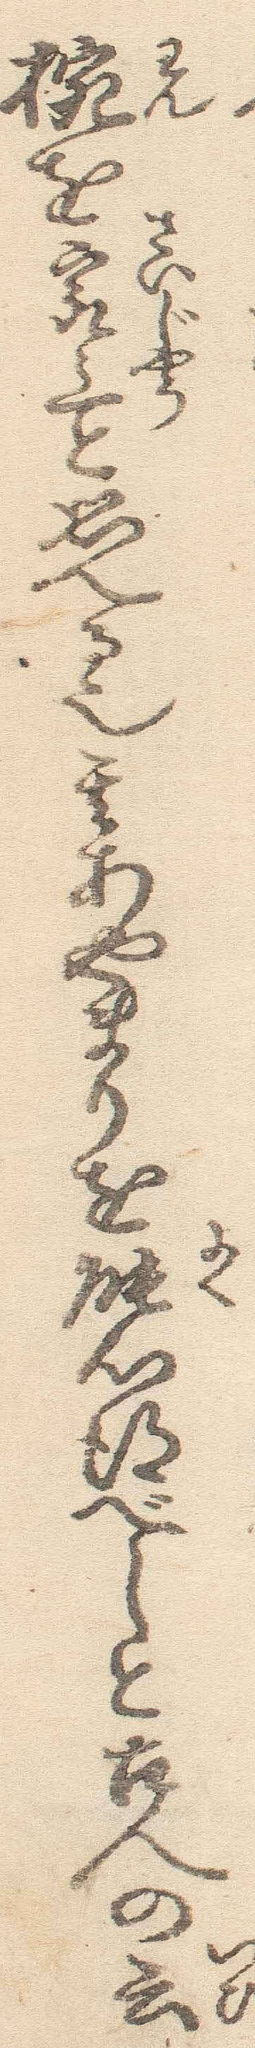椀を最上と思へる也其あやまりを能心得べしと古人の云

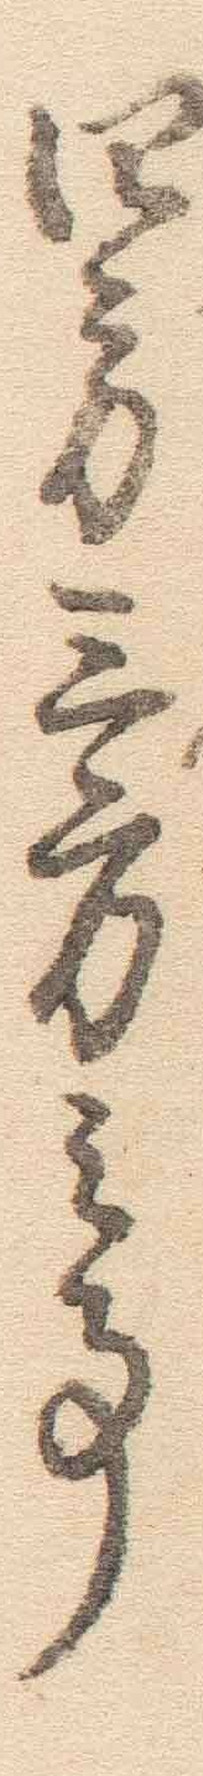四方三方之事
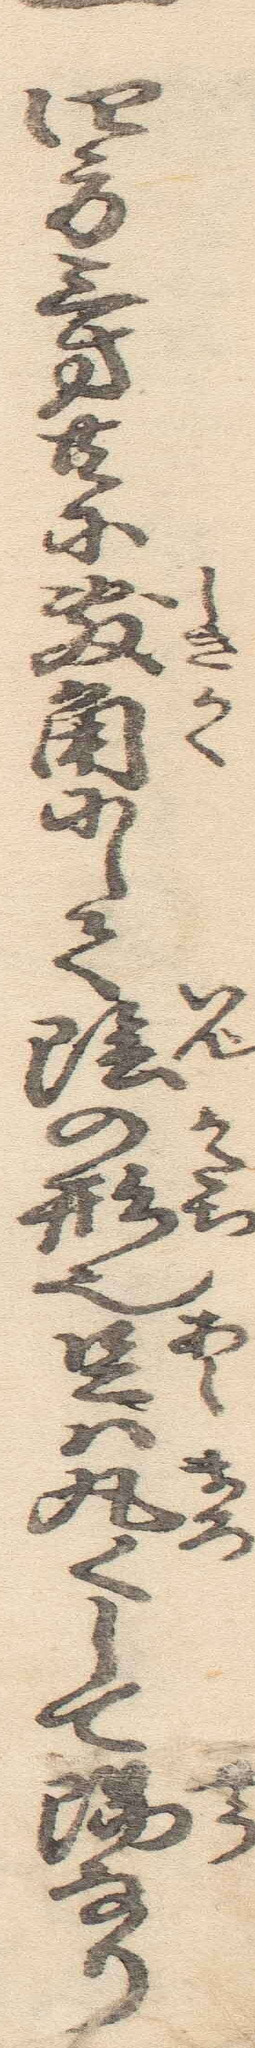一四方三方共に敷角にして陰の形也足は丸くして陽なり
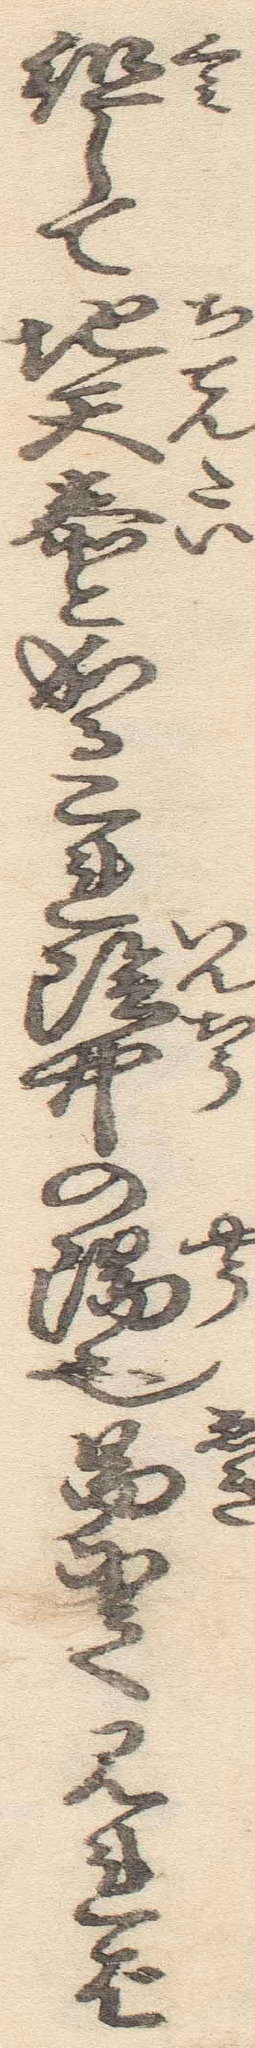組して地天泰と成るこれ陰中の陽也易にて見れば
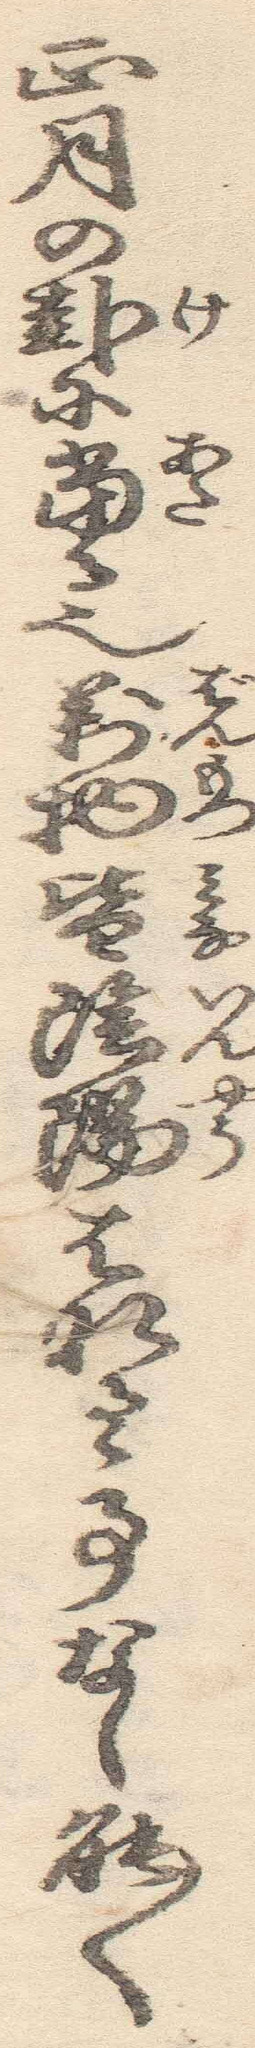正月の卦に当る也万物皆陰陽はなるゝ事なし能く
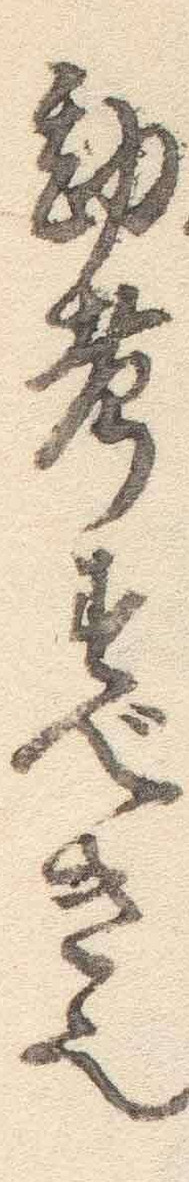勘考すべき也
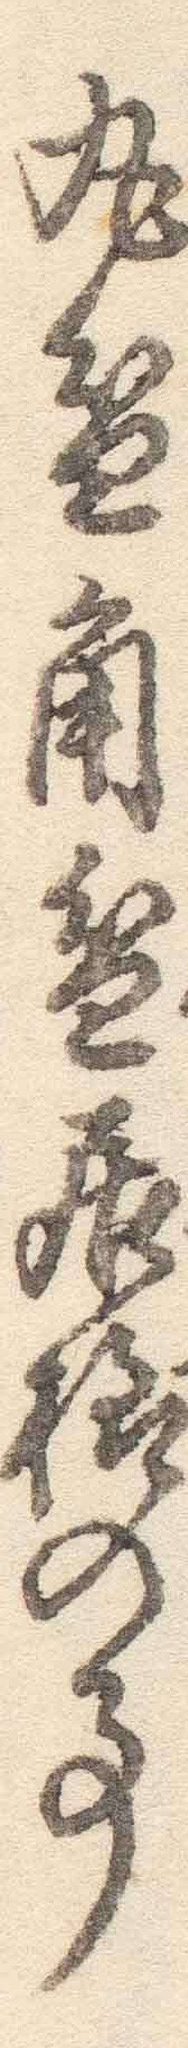丸盆角盆居様の事
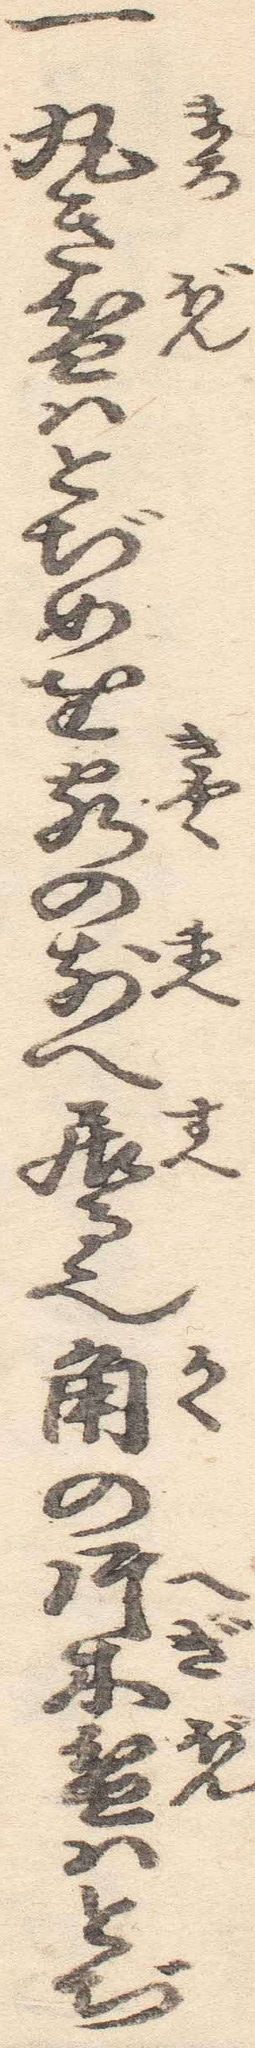一丸き盆はとぢめを客の前へ居る也角の片木盆はとぢ
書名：料理通
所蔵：東京学芸大学附属図書館 国文学研究資料館
